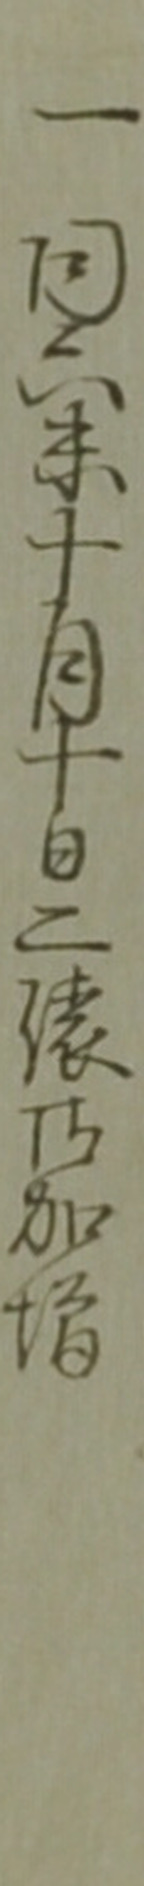一同六未十月十日二俵御加増
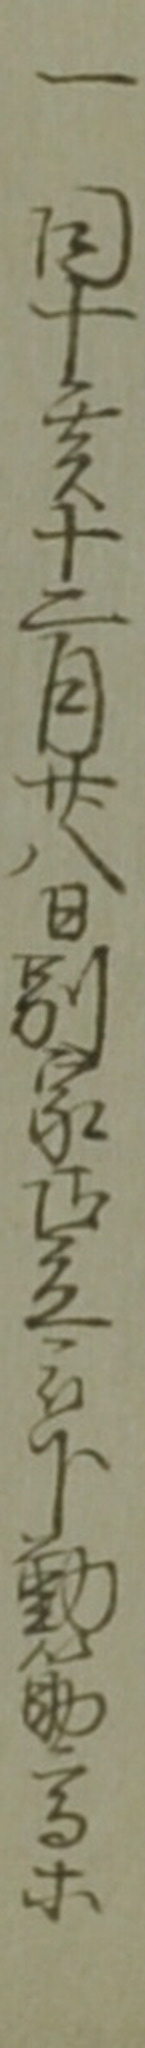一同十亥十二月廿八日別家御立被下勤筋高等
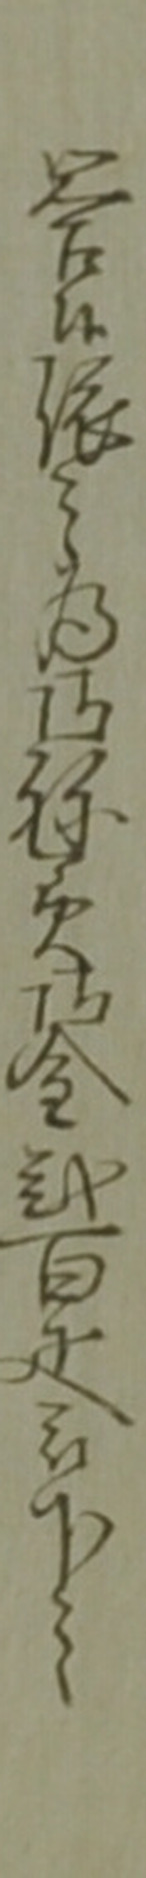思召候依之為御称美御金弐百疋被下之
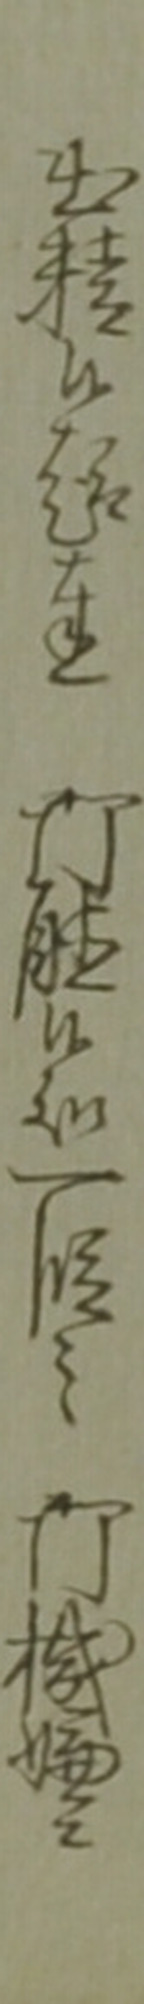出精候趣達御聴候処一段之御機嫌ニ
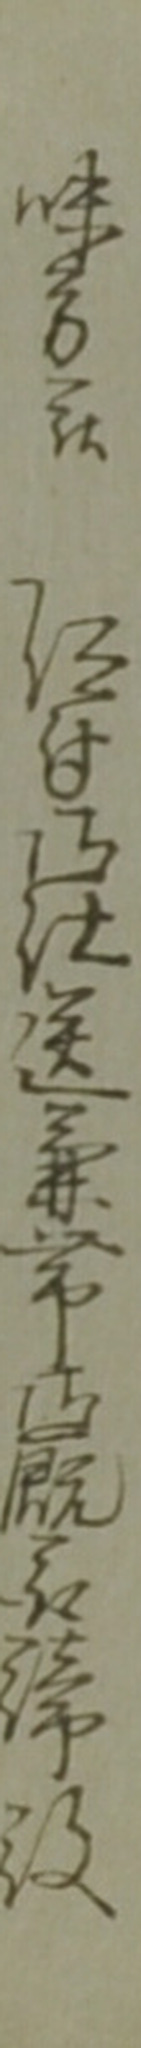味方被仰付御仕送兼帯御厩取締役
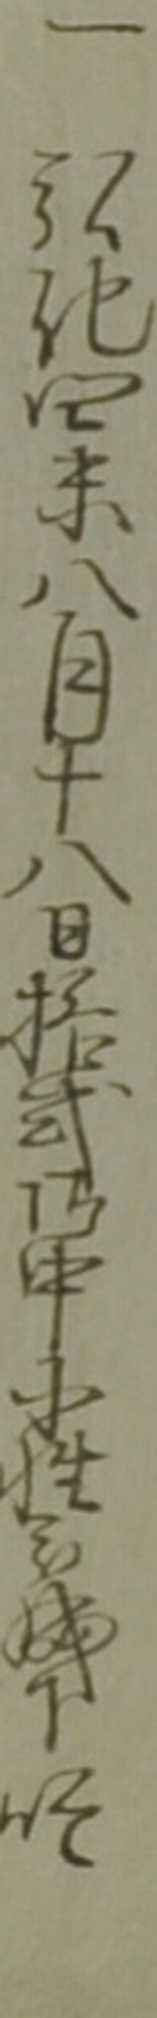一弘化四未八月十八日格式御中小性被成下吟
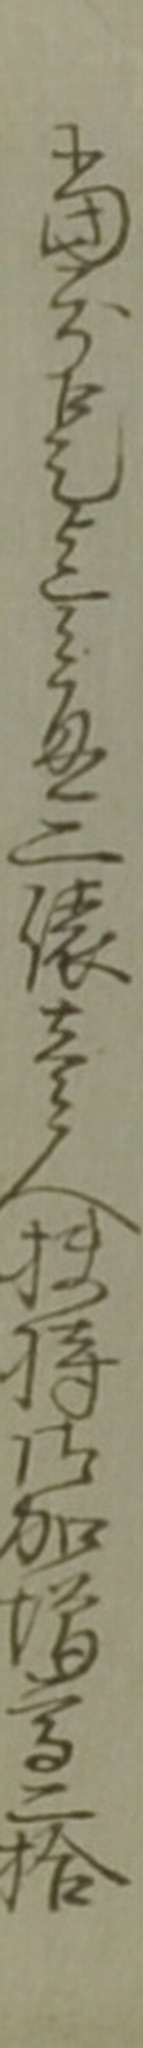当分是迄之通二俵壱人扶持御加増高二拾
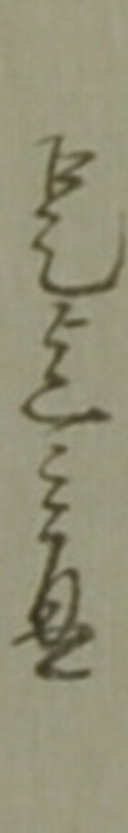是迄之通
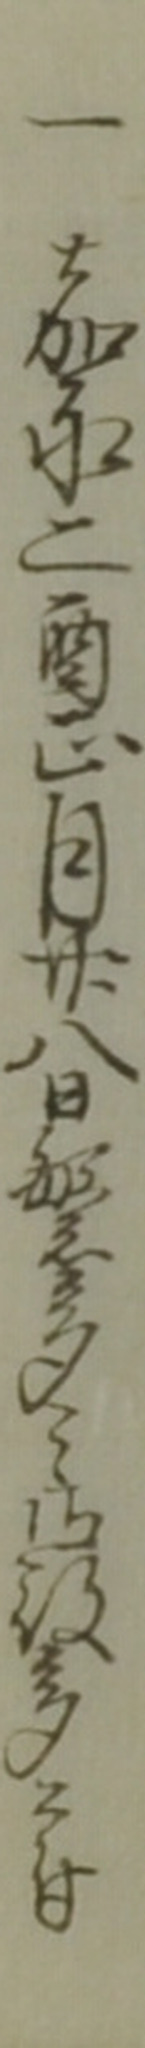一嘉永二酉正月廿八日繁多之御役多ニ付
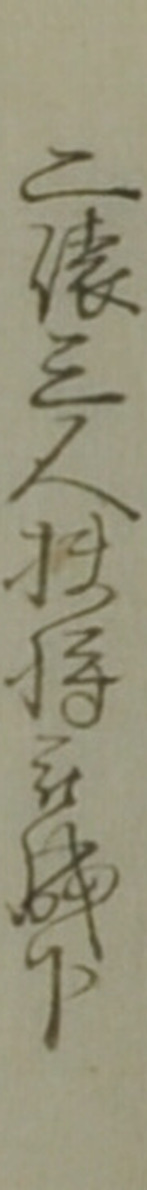二俵三人扶持被下之
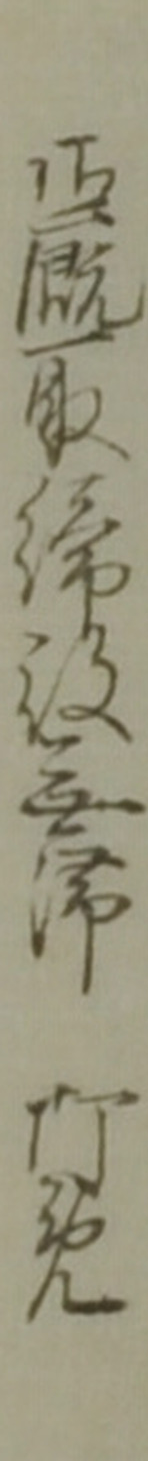御厩取締役無滞御免
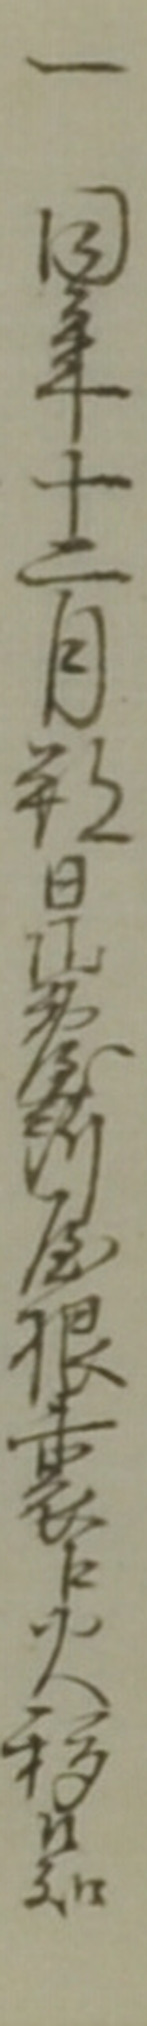一同年十二月朔日御台所屋根裏江火移候処
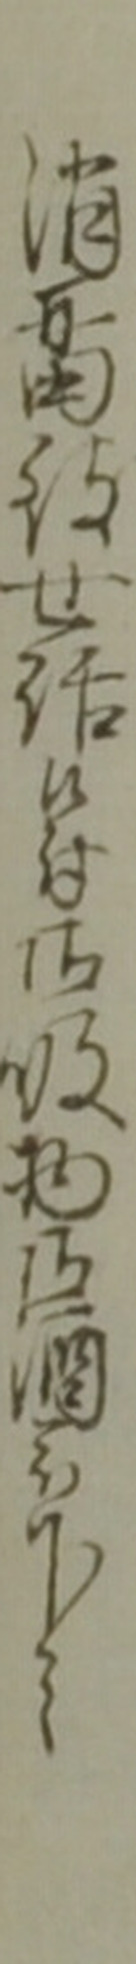消留致世話候付御吸物御酒被下之

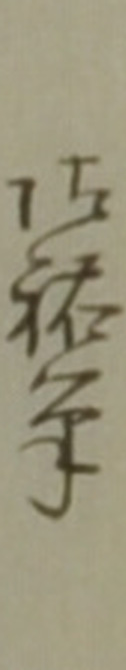御祐筆
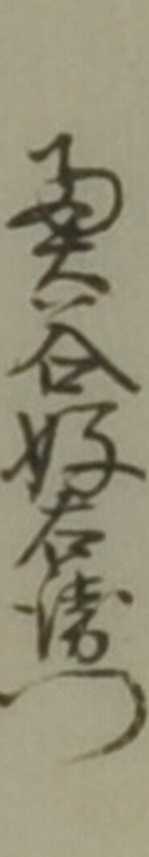奥谷源左衛門
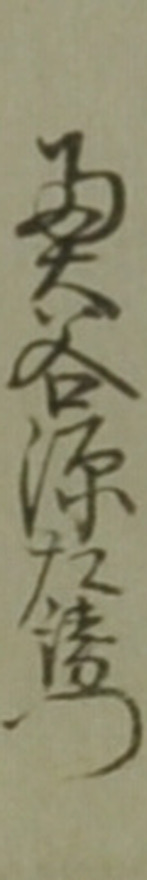奥谷源左衛門
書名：無足諸士勤仕録（二）
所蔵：伊那市立高遠町図書館・合同会社AMANE
